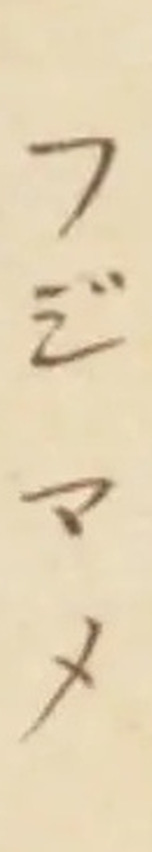フジマメ
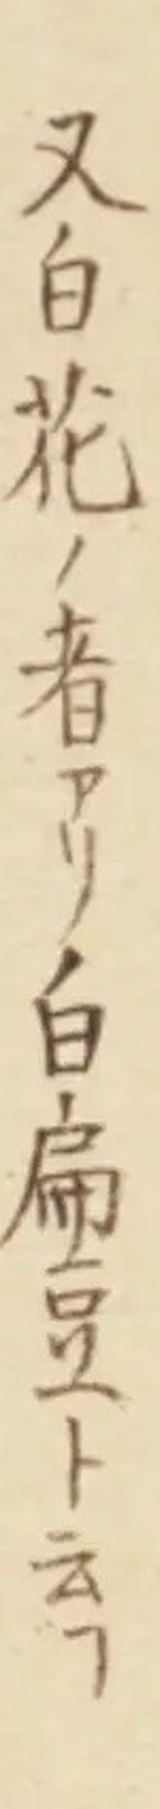又白花ノ者アリ白扁豆ト云フ
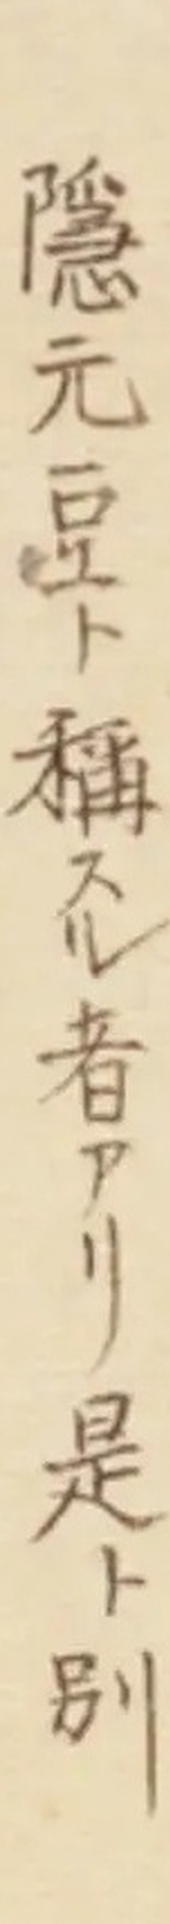隠元豆ト稱スル者アリ是ト別
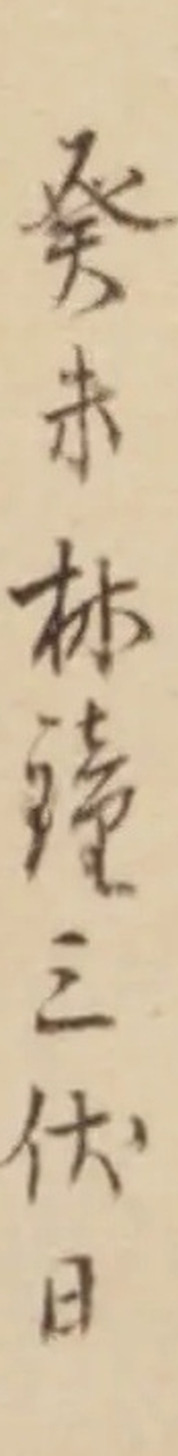癸未夏林鐘三伏日
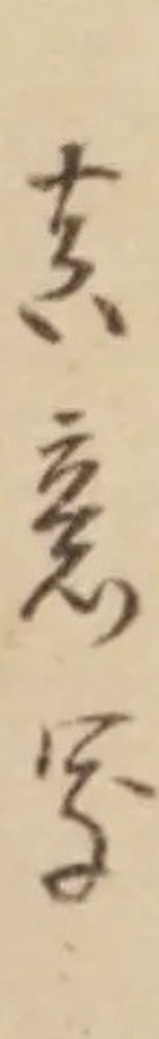真意寫

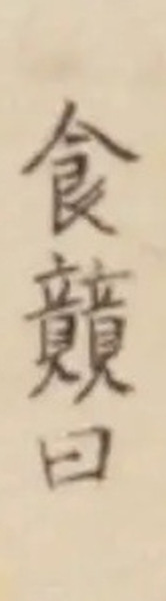食競曰
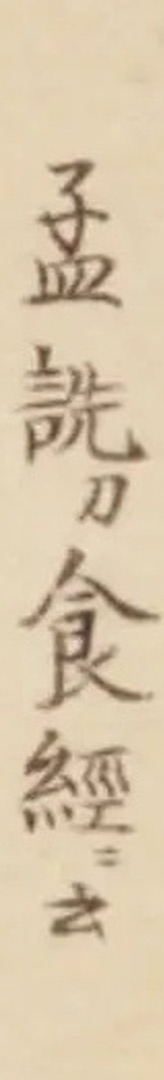孟詵カ食経ニ云
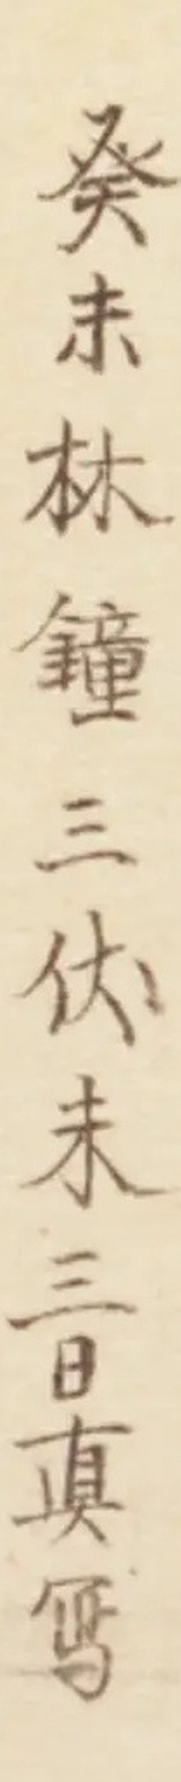癸未林鐘三伏未日真寫
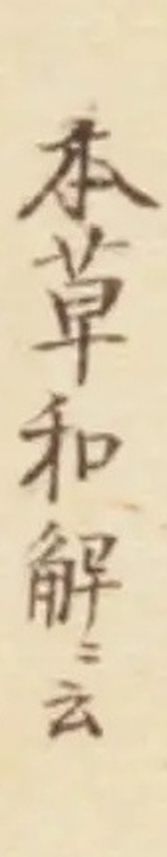本草和解に云
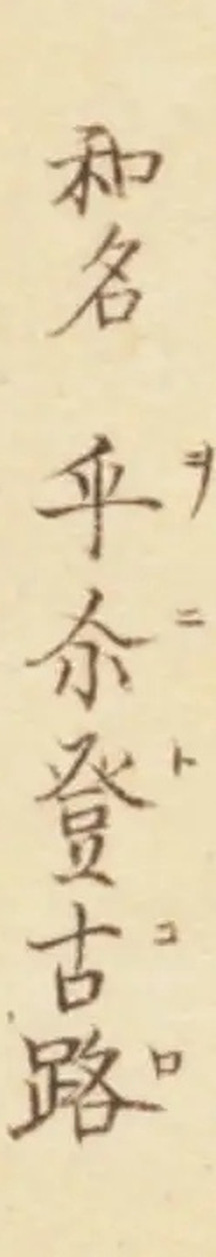和名乎尓登古路
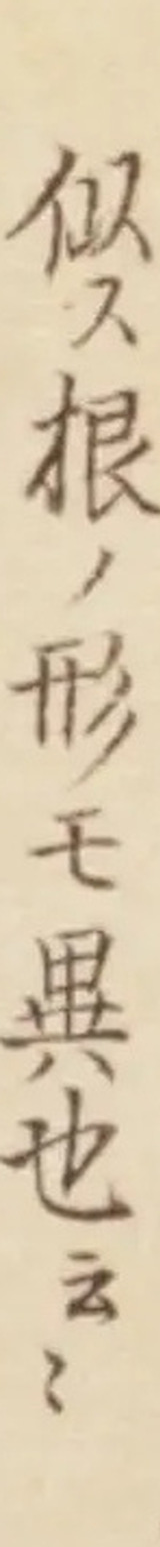似ス根ノ形モ異也云々
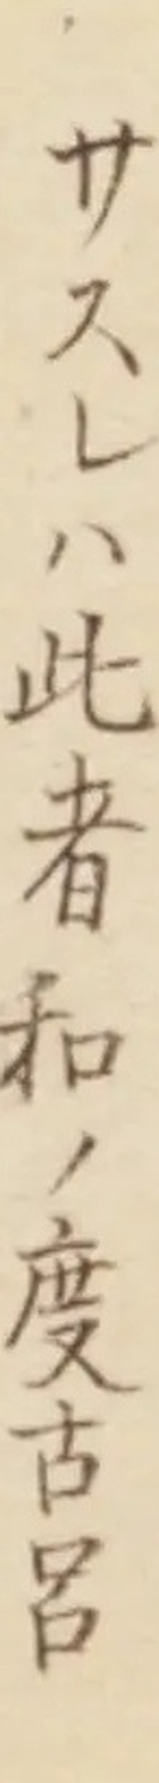サスレハ此者和ノ度古路
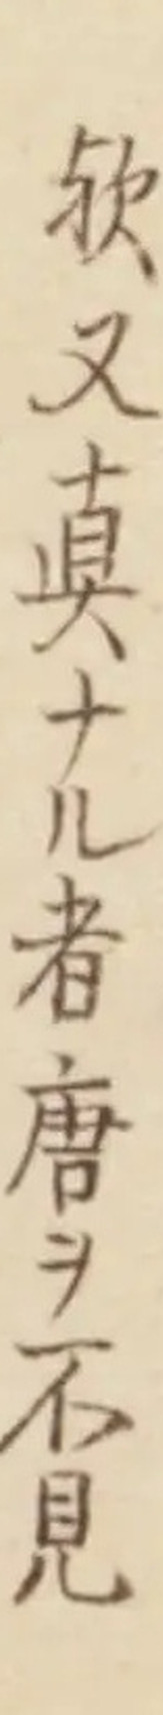欤又直ナル者唐ヲ不見
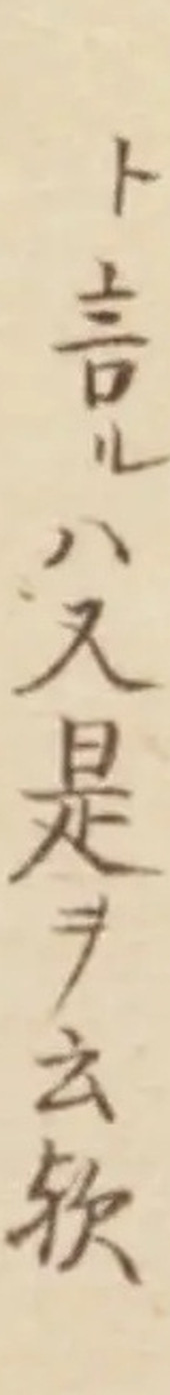ト言ルハ又是ヲ云欤
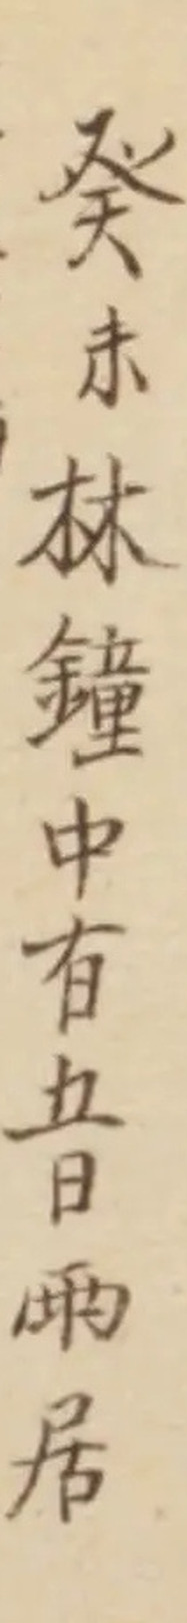癸未林鐘中有五日雨居
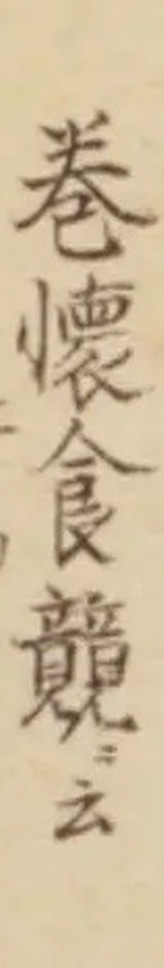巻懐食競ニ云
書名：梅園草木花譜夏之部. 2
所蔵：国立国会図書館 National Diet Library, JAPAN
